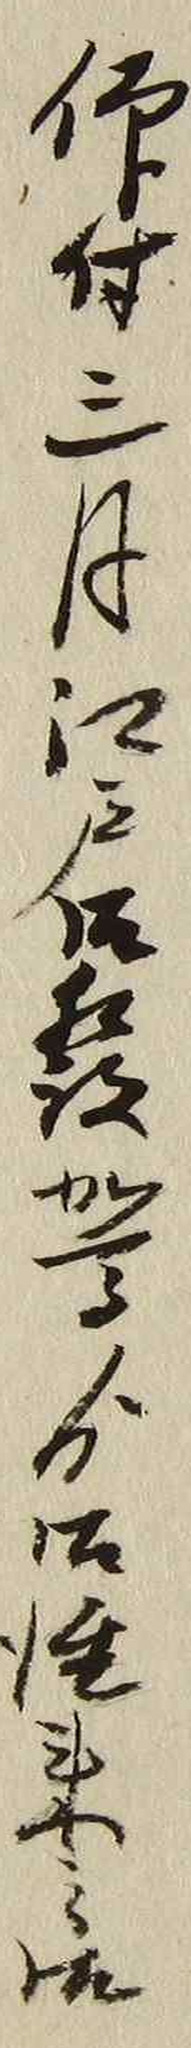仰付三月江戸御発駕ゟ御往来之御
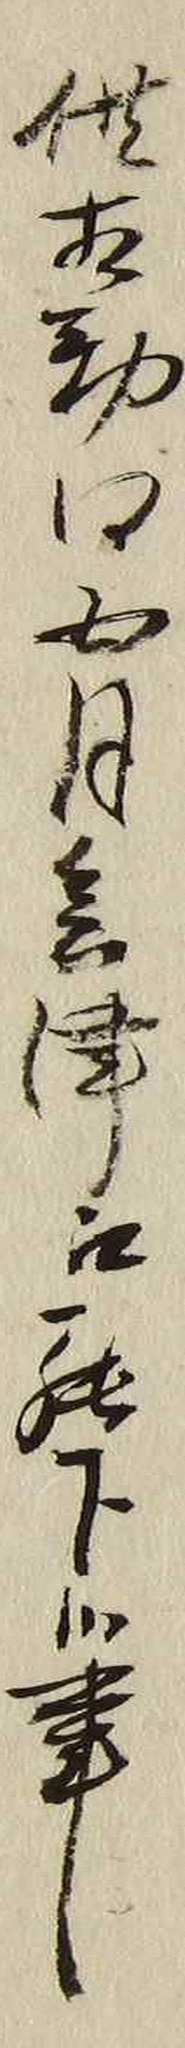供相勤同五月会津江罷下候事
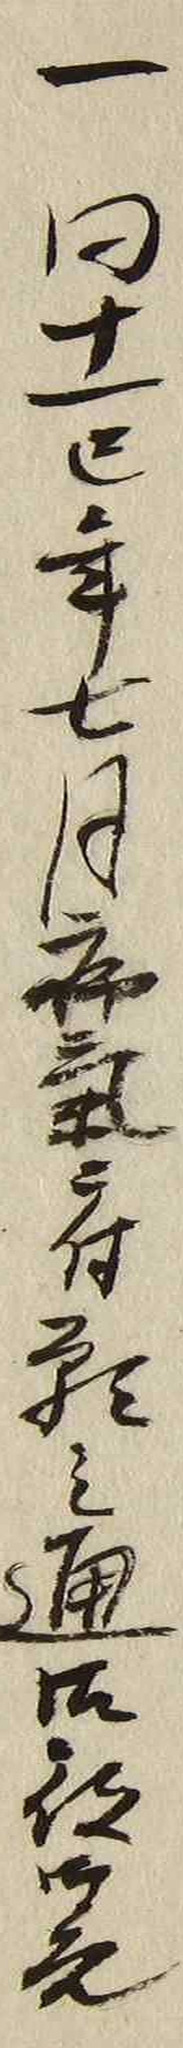一同十一巳年七月病気ニ付願之通御役御免
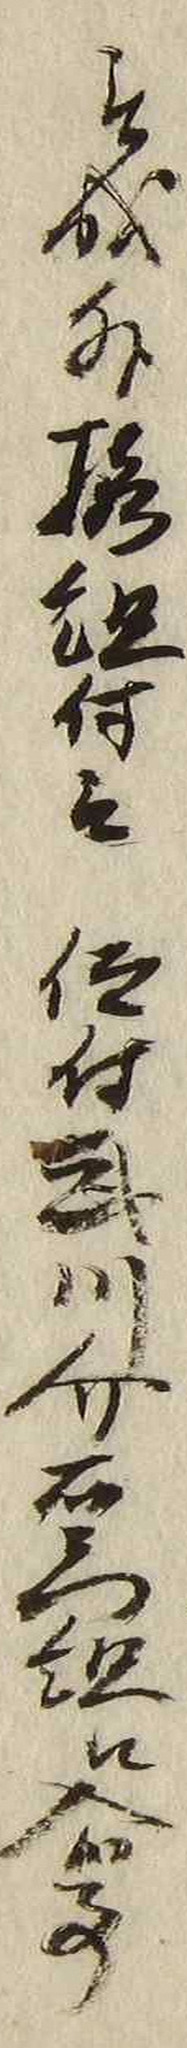罷成外様組付被仰付武川介右衛門組江入候事

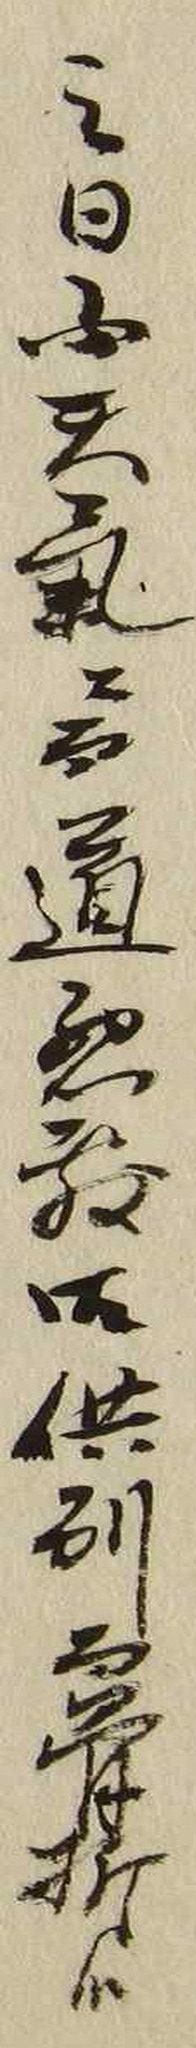之日不天気ニ而道悪敷御供別而骨折候
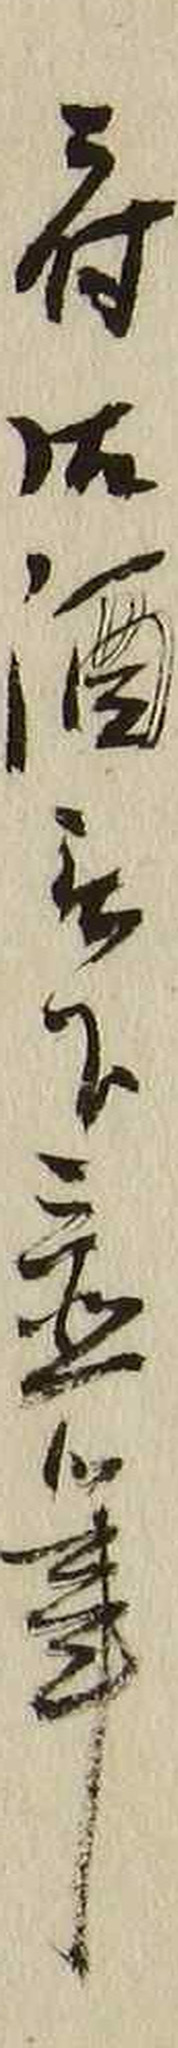ニ付御酒被下置候事
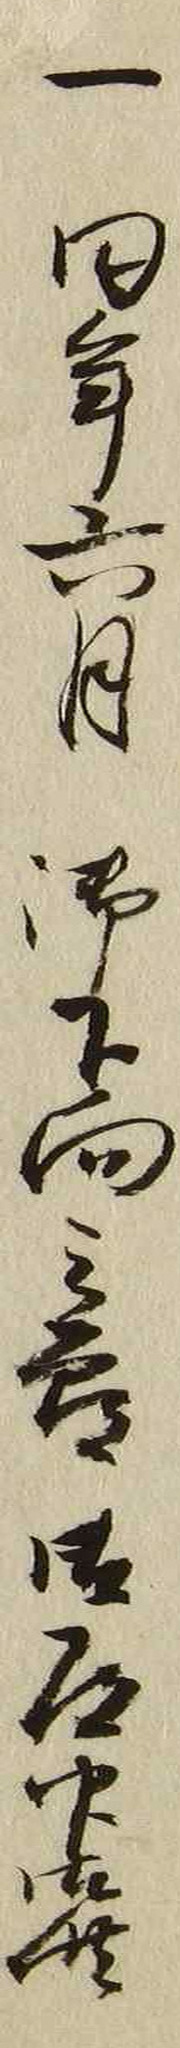一同年六月御下向之節御道中御供
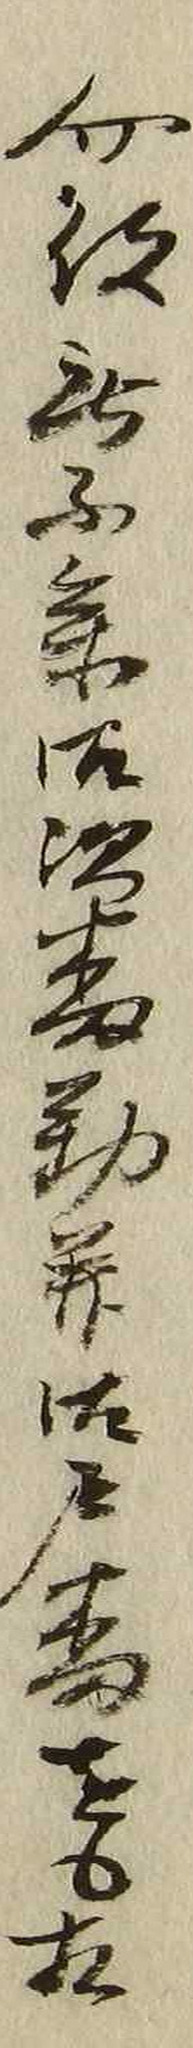介役無不参御次番勤并御戸番をも相
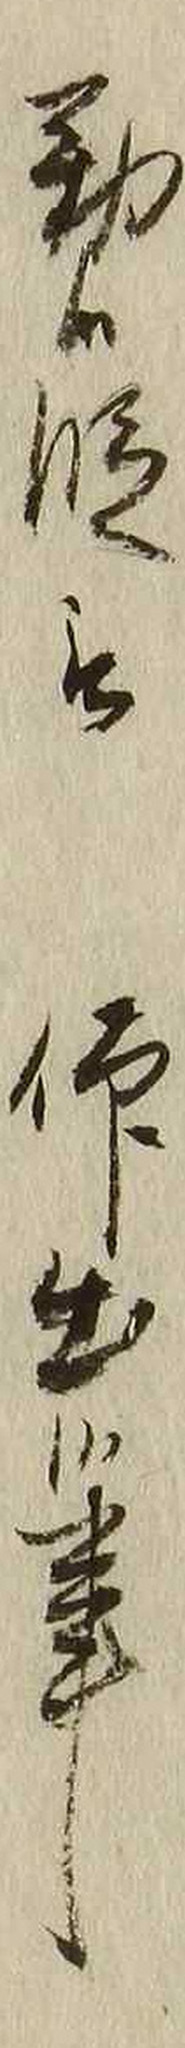勤候段被仰出候事
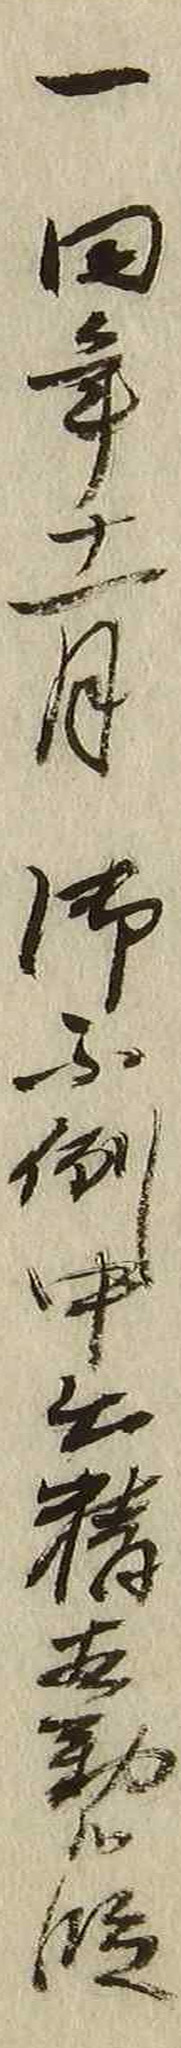一同年十一月御不例中出精相勤候段
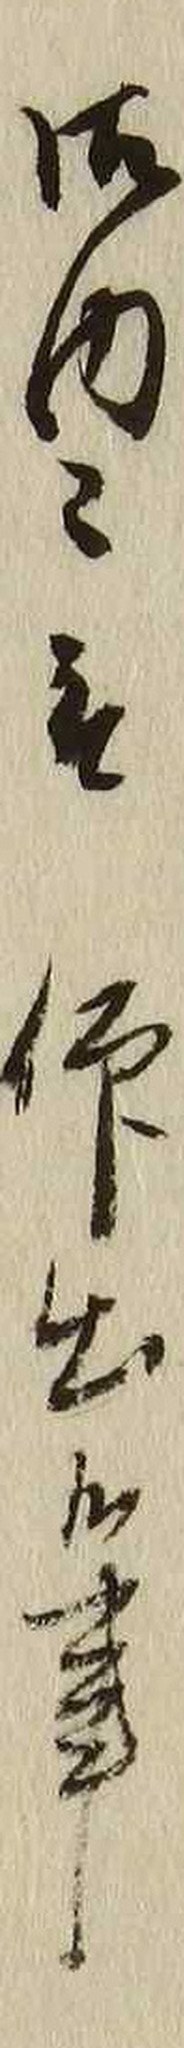御内々被仰出候事
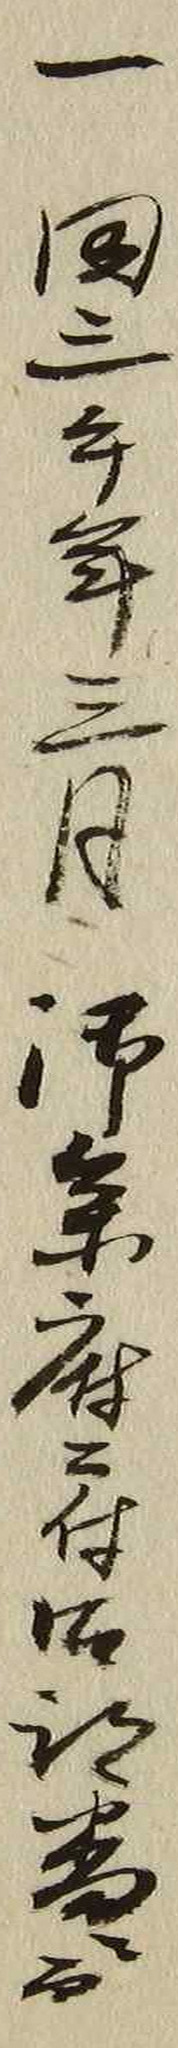一同三午年三月御参府ニ付御跡番ニ而
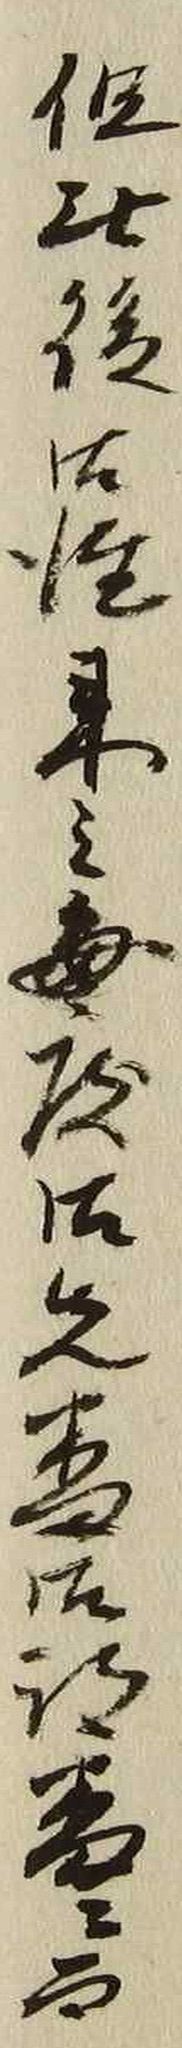但此後御往来之毎度御先番御跡番ニ而
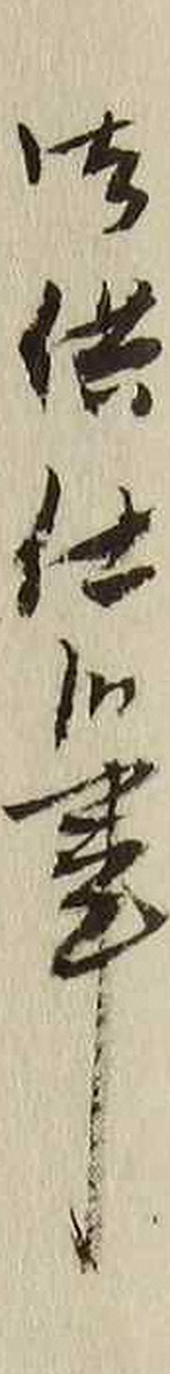御供仕候事
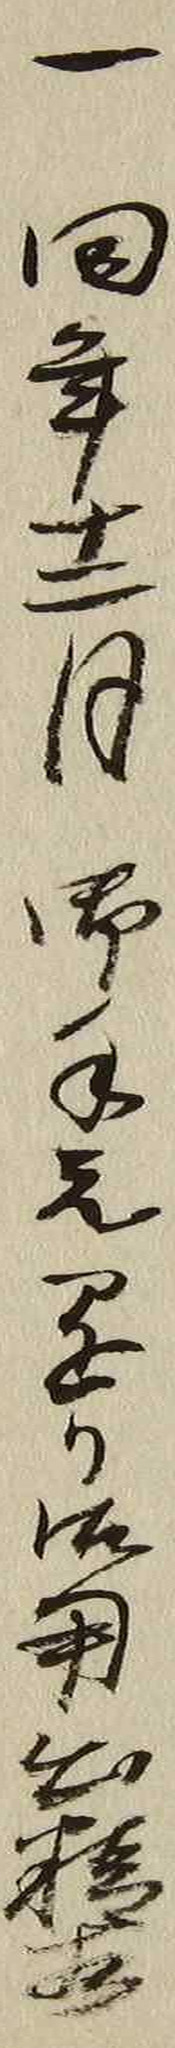一同年十二月御手元懸り御用出精相
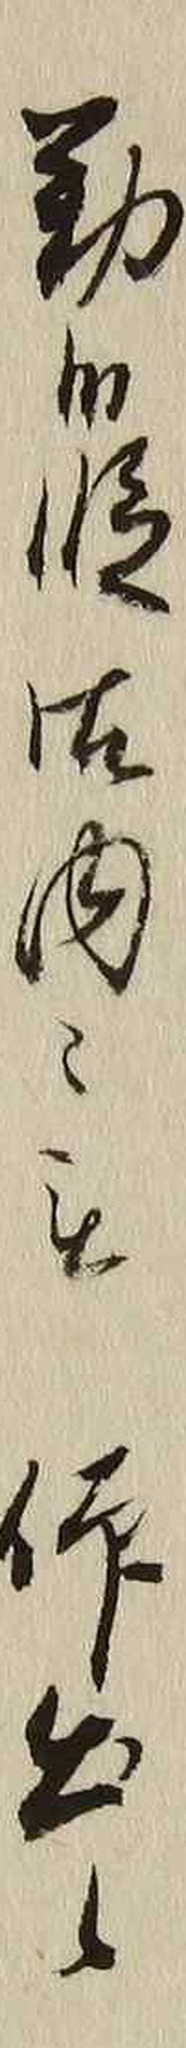勤候段御内々被仰出候
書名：諸士系譜　巻之345　も之部1
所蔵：会津若松市立会津図書館
